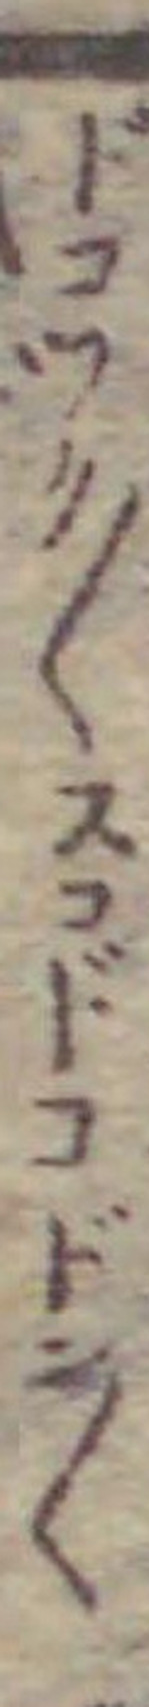ドコツク〳〵スコドコドン〳〵
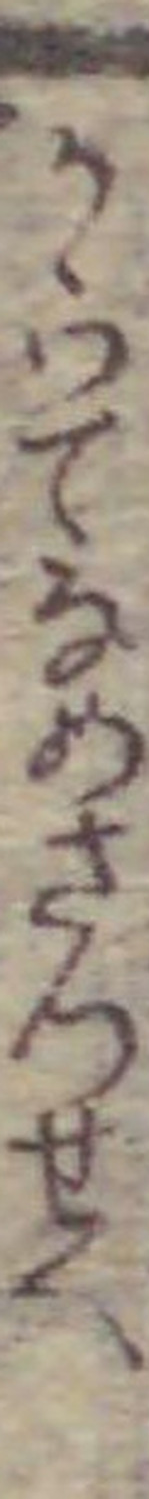かゝつてなめさつせへ
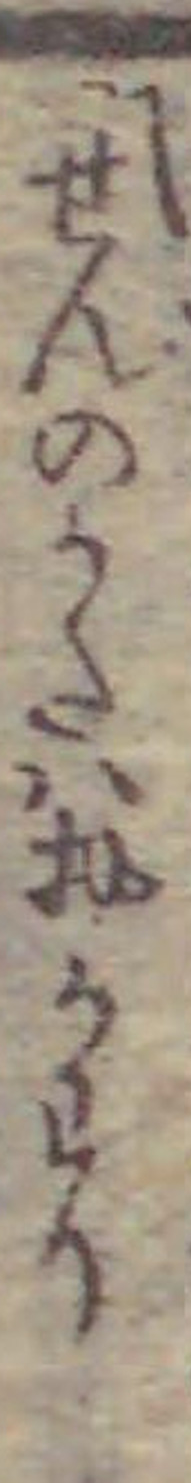〽せんのかたはおかわり

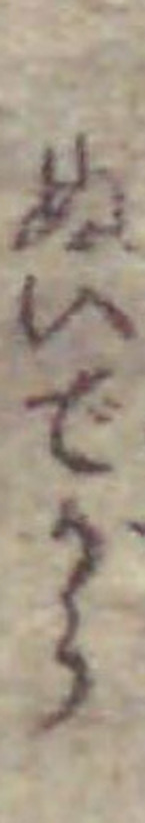ぬいでから
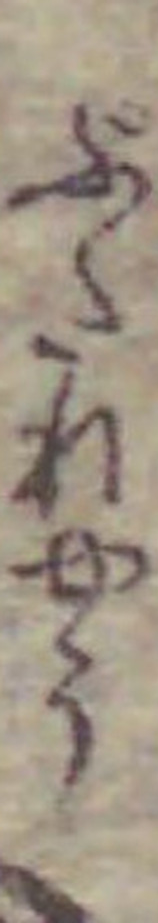ぶたれやう
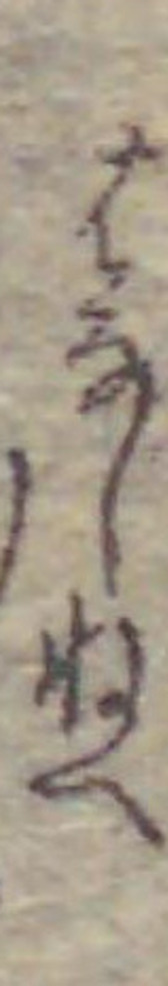はなしねへ
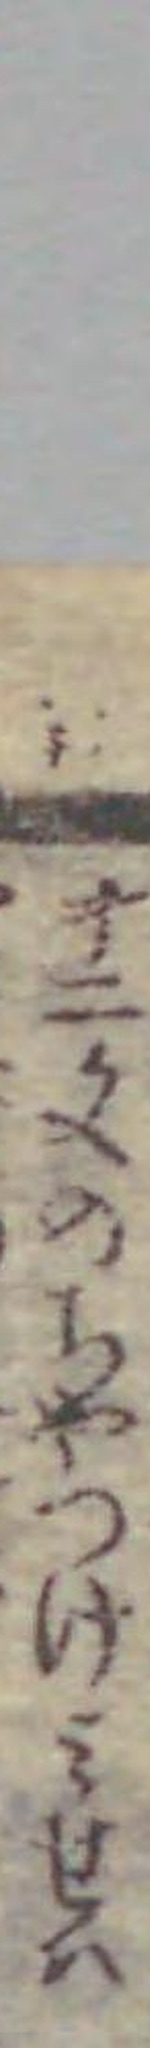十二文のちやつけみせは
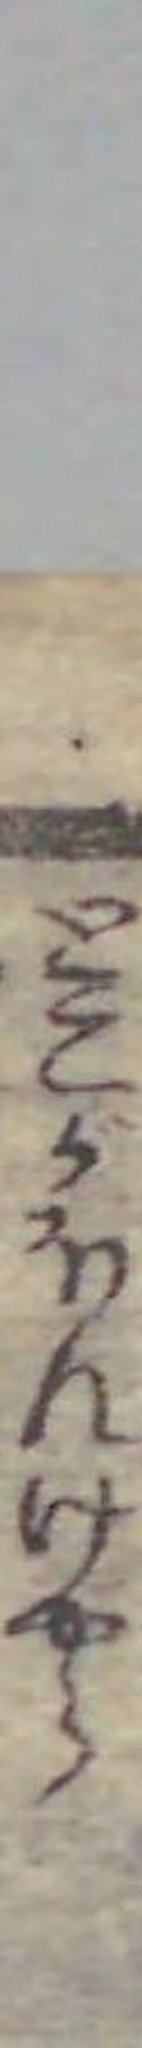とこがほんけやら
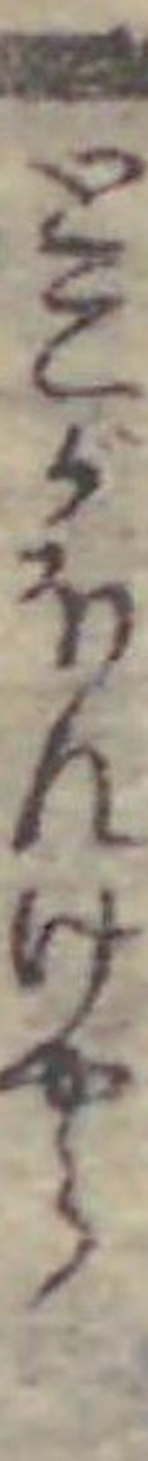とこがほんけやら
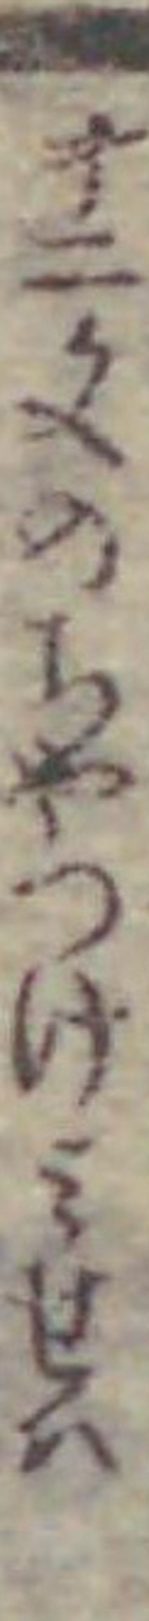十二文のちやつけみせは
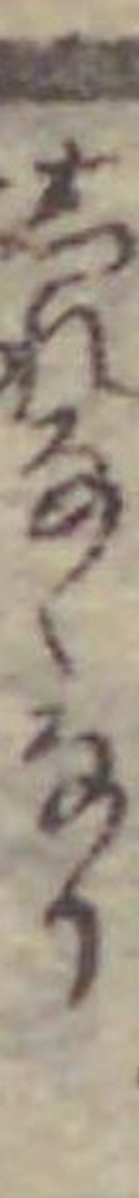忘れなくなり
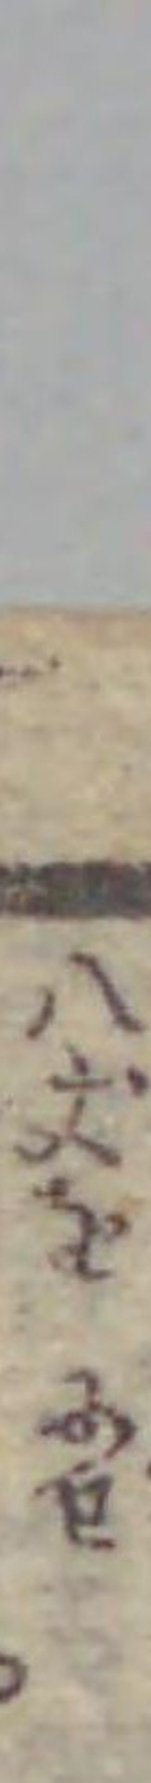八丈をにせ
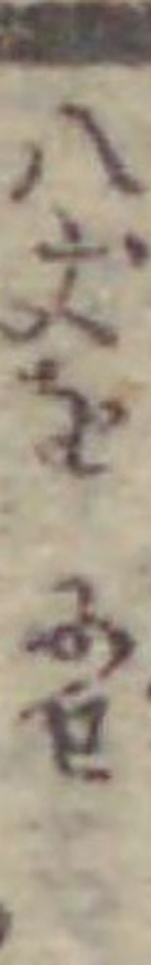八丈をにせ
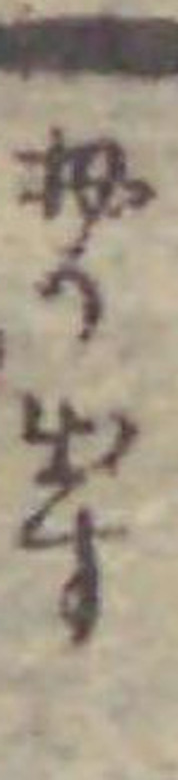おり出す
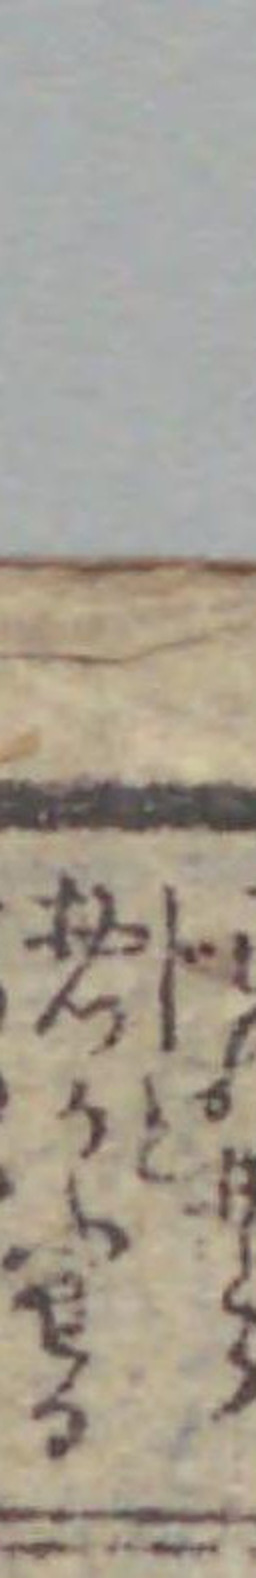おつかふせる
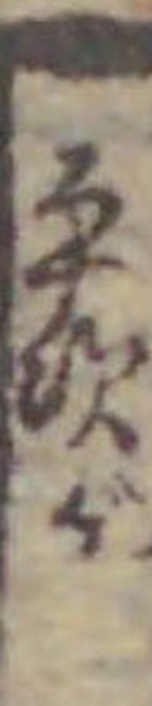平次が
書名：箱入娘面屋人魚 3巻
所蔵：国立国会図書館 National Diet Library, JAPAN
